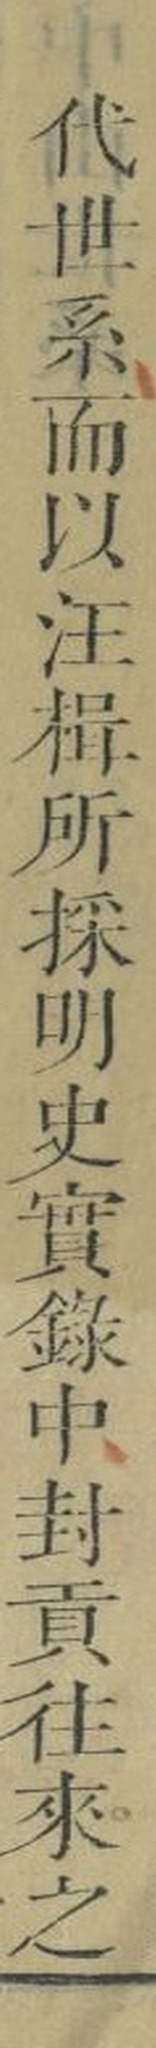代世系而以汪楫所採明史実録中封貢往来之
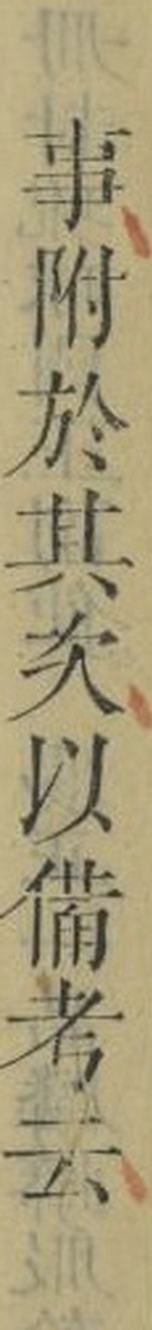事附於其次以備考云
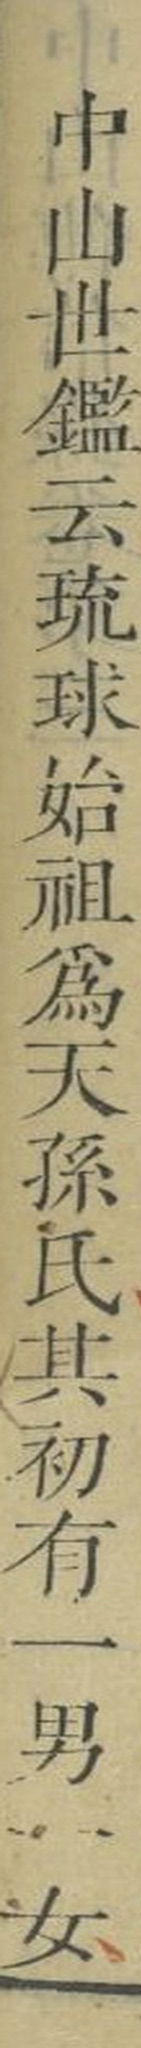中山世鑑云琉球始祖為天孫氏其初有一男一女
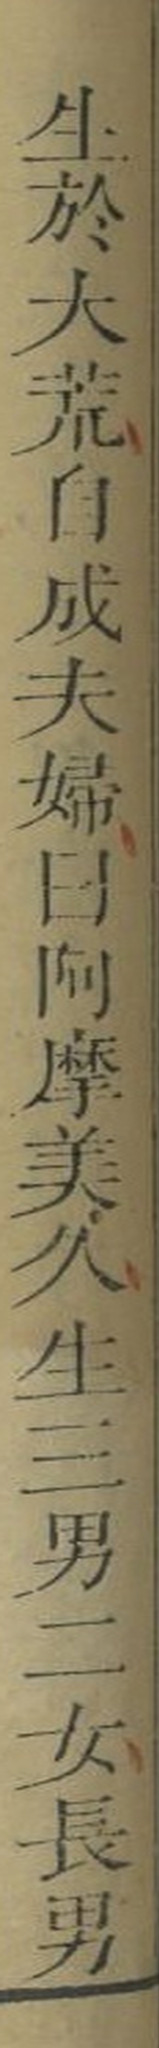生於大荒自成夫婦曰阿摩美久生三男二女長男
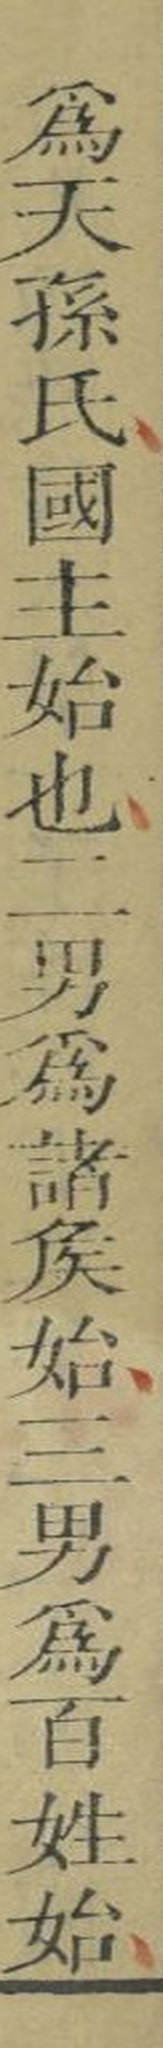為天孫氏国主始也二男為諸侯始三男為百姓始
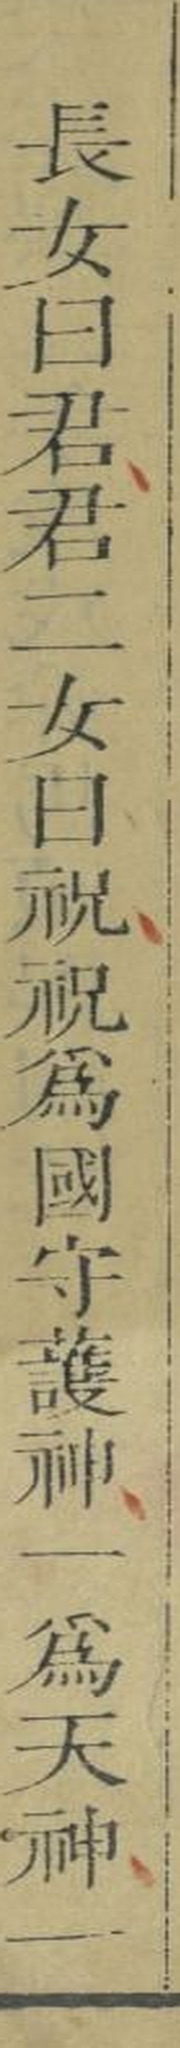長女曰君君二女曰祝祝為国守護神一為天神一
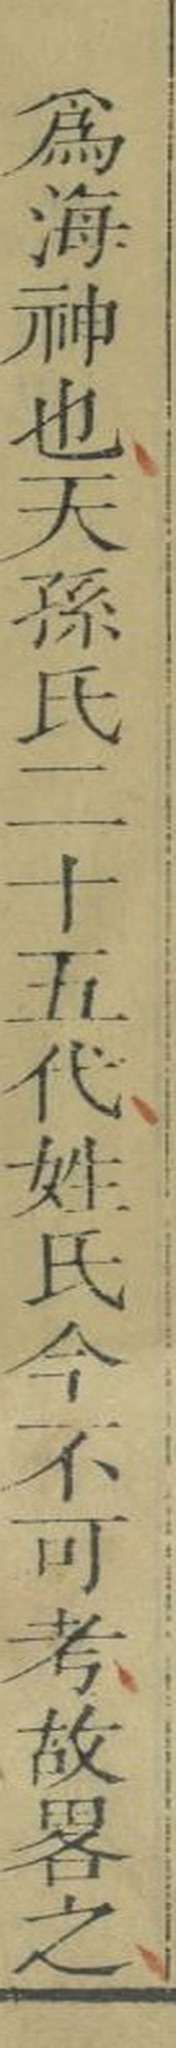為海神也天孫氏二十五代姓氏今不可考故略之
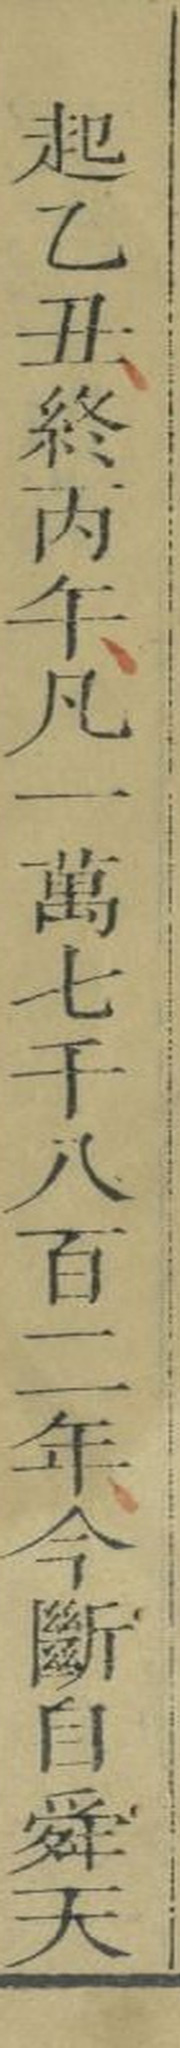起乙丑終丙午凡一万七千八百二年今断自舜天
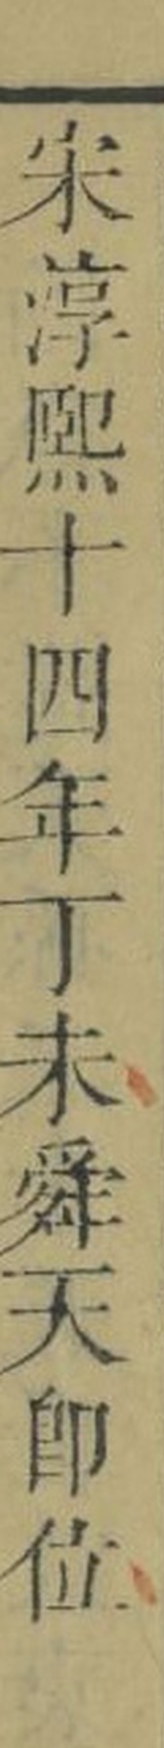宋淳熙十四年丁未舜天即位
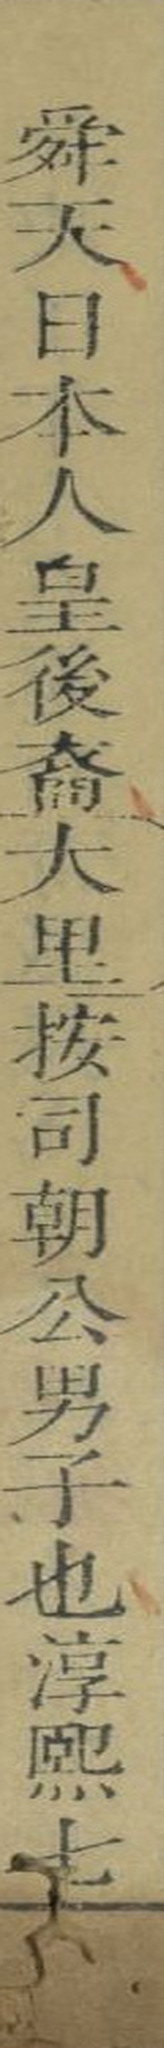舜天日本人皇後裔[大里]按司朝公男子也淳熙七

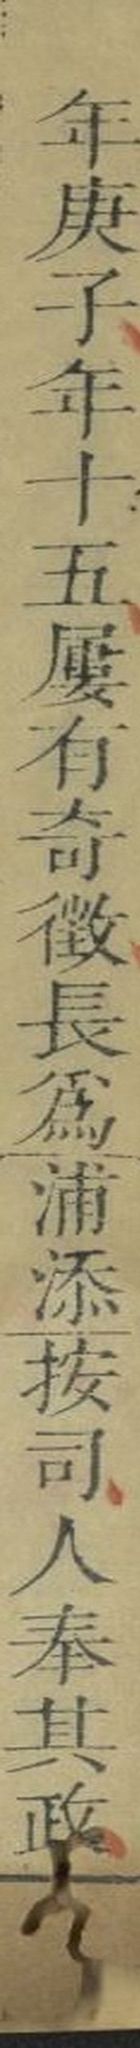年庚子年十五屢有奇徴長為[浦添]按司人奉其政
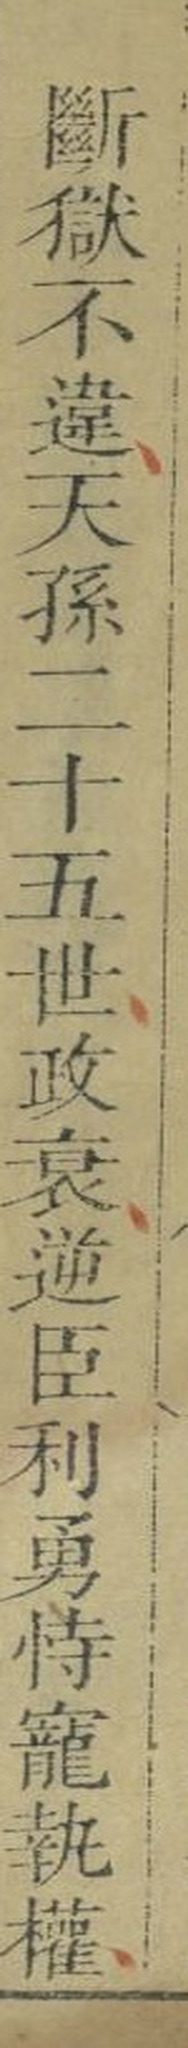断獄不違天孫二十五世政衰逆臣利勇恃寵執権
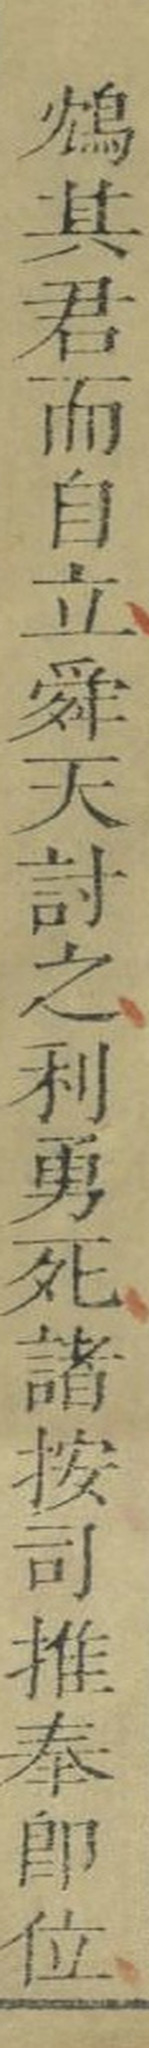鴆其君而自立舜天討之利勇死諸按司推奉即位
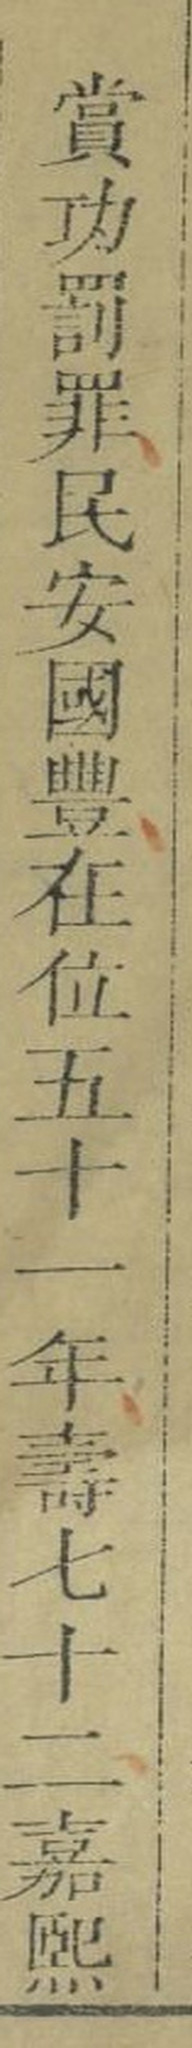賞功罰罪民安国豊在位五十一年寿七十二嘉熙
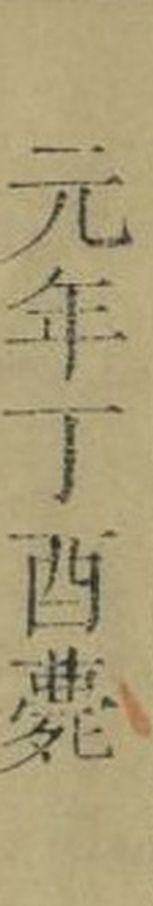元年丁酉薨
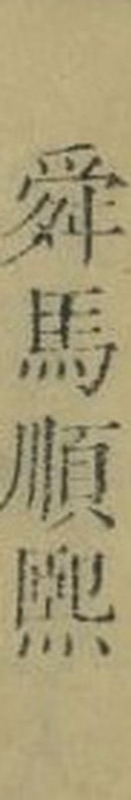舜馬順熙
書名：中山伝信録 巻三
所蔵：University of the Ryukyus Library
